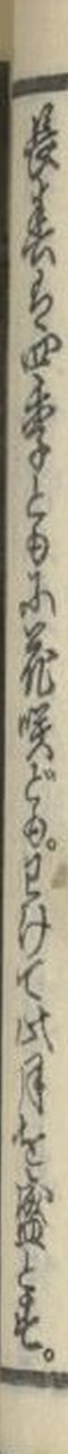長春は四季ともに花咲ども。わけて此月を盛とす。
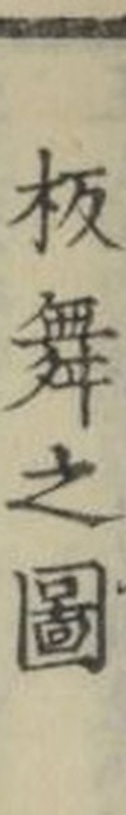板舞之図

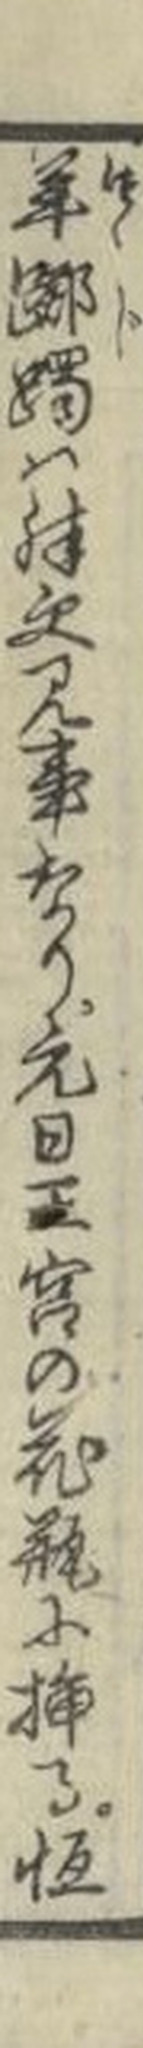羊躑躅は殊に見事なり。元日王宮の花瓶に挿る。恒
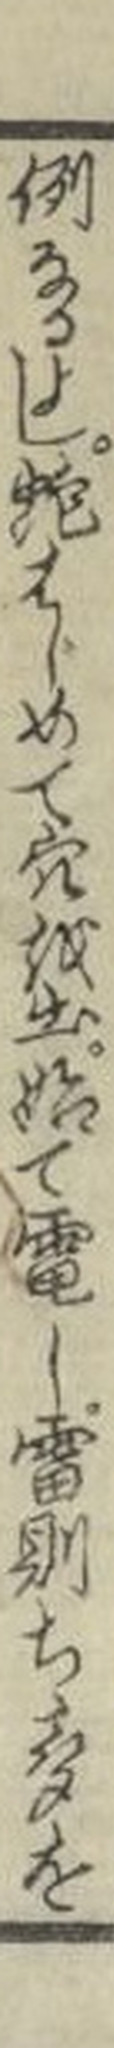例なるよし。蛇はじめて穴を出。始て電し。雷則ち声を
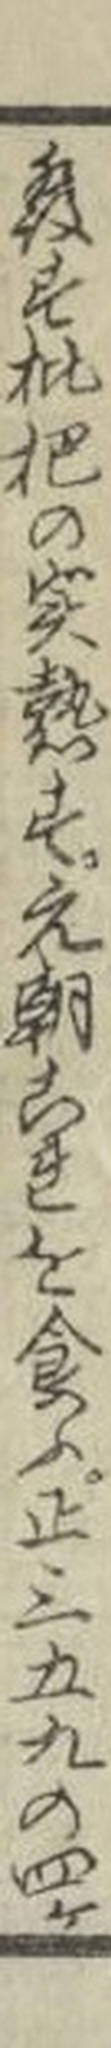発す枇杷の実熟す。元朝これを食ふ。正三五九の四ヶ
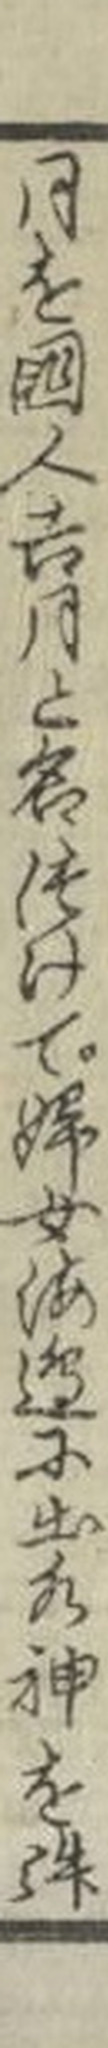月を国人吉月と名つけて。婦女海辺に出水神を拝
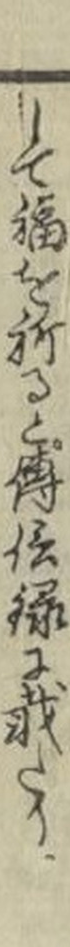して福を祈ると。伝信録に載たり。
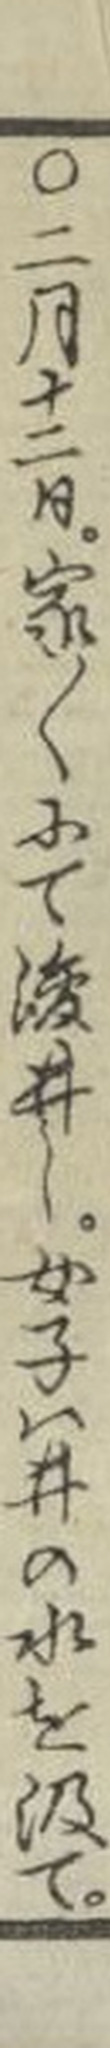○二月十二日。家〳〵にて浚井し。女子は井の水を汲て。
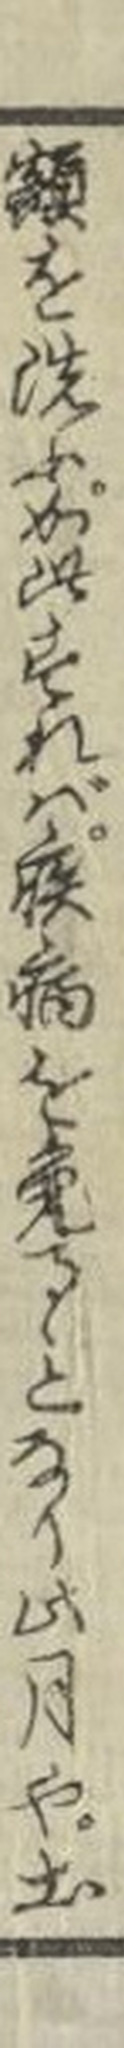額を洗ふ。如此すれば。疾病を免るゝとなり此月や。土
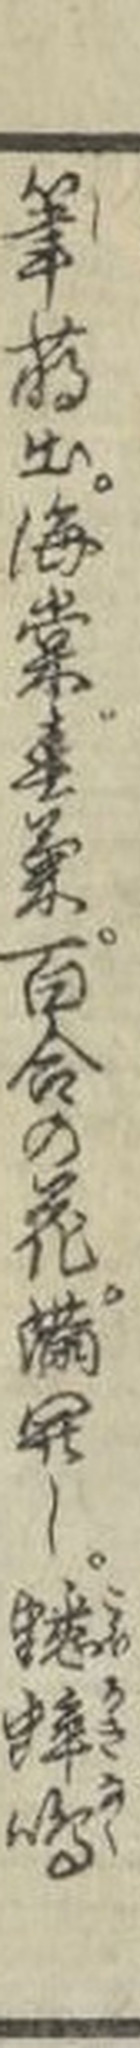筆萌出。海棠。春菊。百合の花。満開し。蟋蟀鳴。
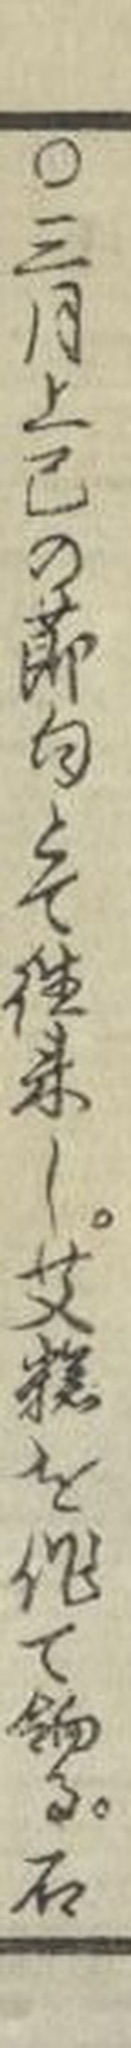○三月上巳の節句とて徃来し。艾糕を作て餉る。石
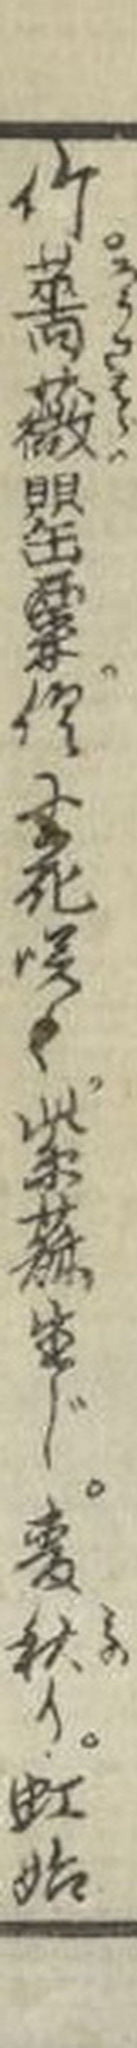竹。薔薇罌粟。倶に花咲く。紫藤生じ。麦秋り。虹始
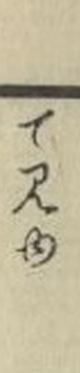て見ゆ
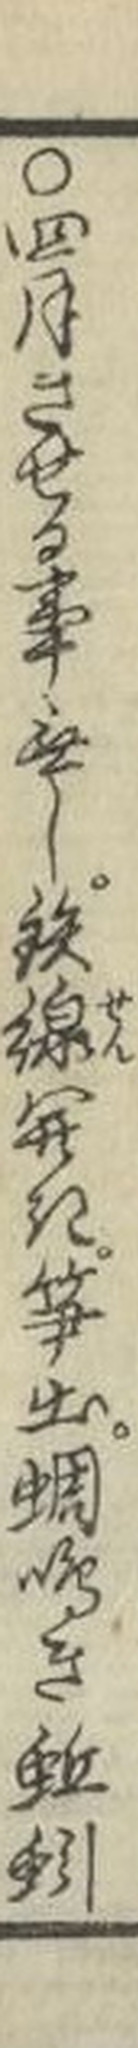○四月させる事無し。鉄線開き。笋出。蜩鳴き蚯蚓
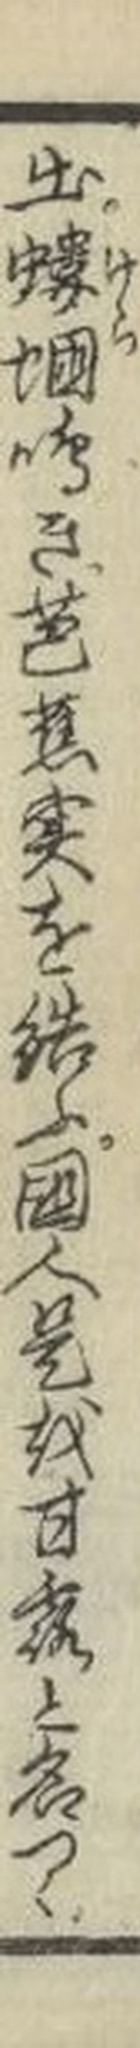出。螻蝈鳴き。芭蕉実を結ふ。国人是を甘露と名つく。
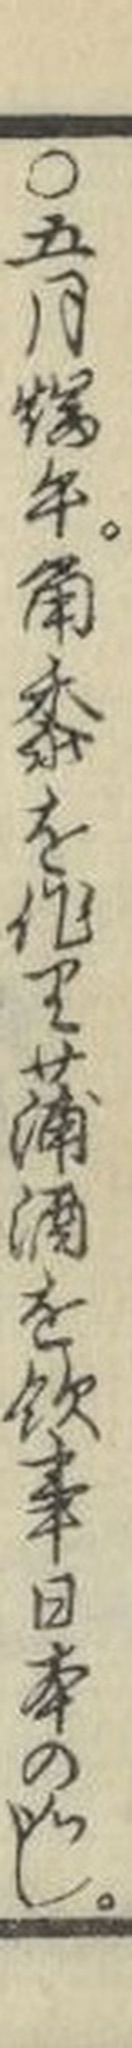○五月端午。角黍を作り蒲酒を飲事日本の如し。
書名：琉球解語
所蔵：University of the Ryukyus Library
